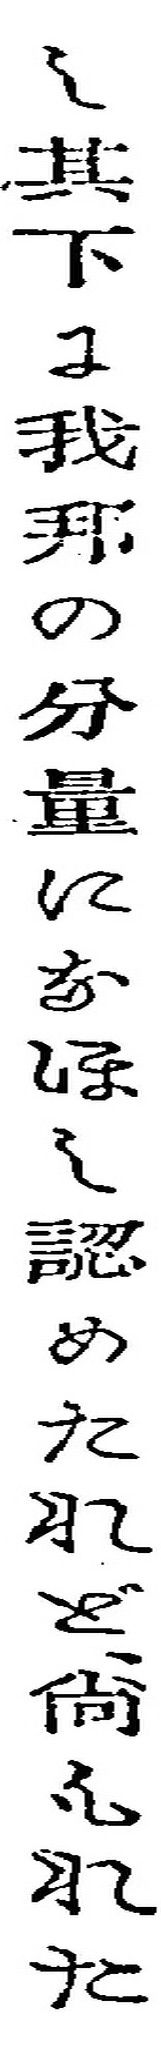し其下に我邦の分量になほし認めたれど、尚もれた
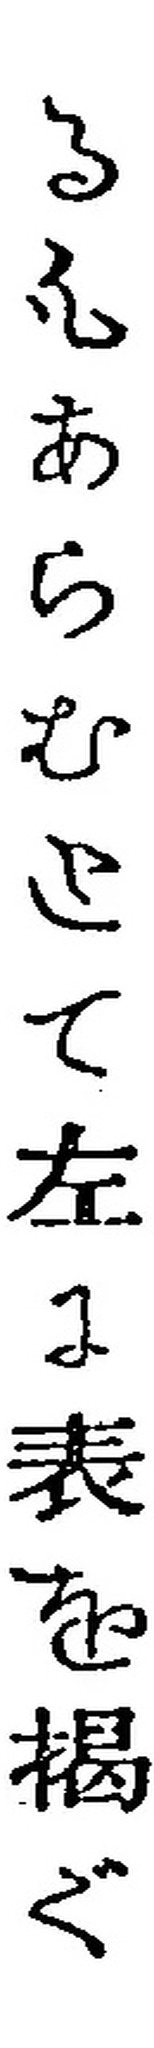るもあれむとて左に表を掲ぐ
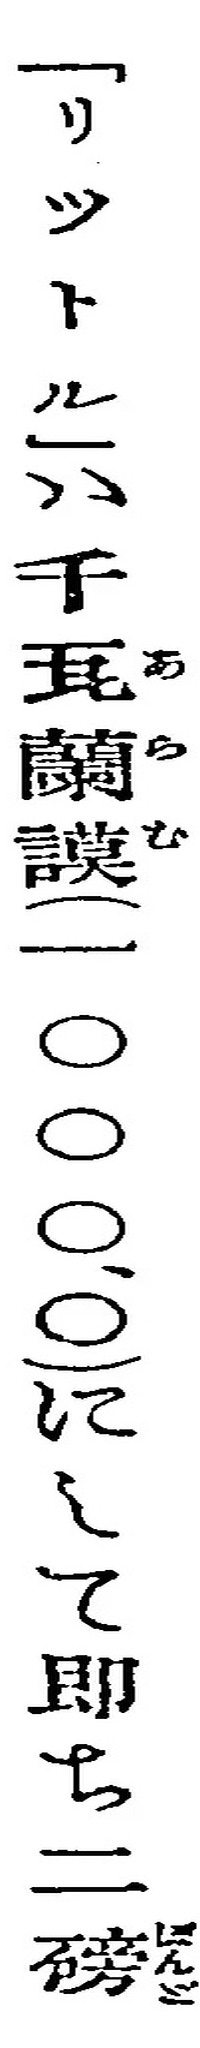[リツトル]は千瓦蘭謨[一〇〇〇、〇]にして即ち二磅
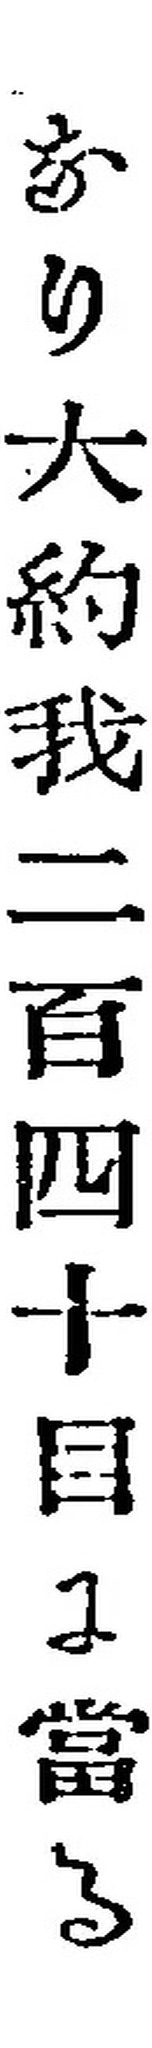なり大約我二百四十目に当る
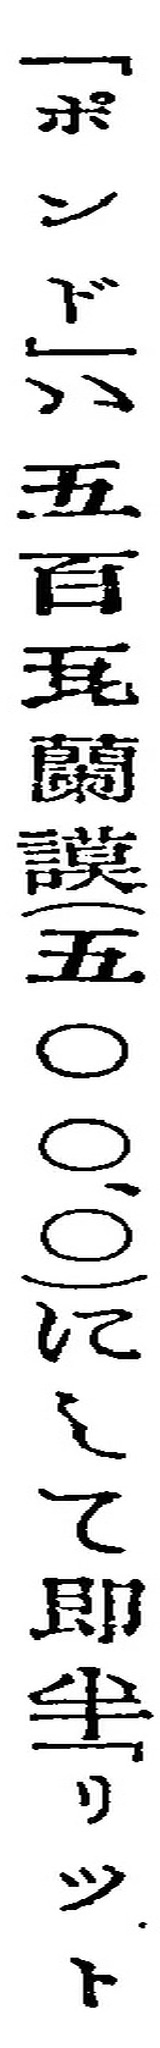[ポンド]は五百瓦蘭謨[五〇〇〇]にして即半[リツト

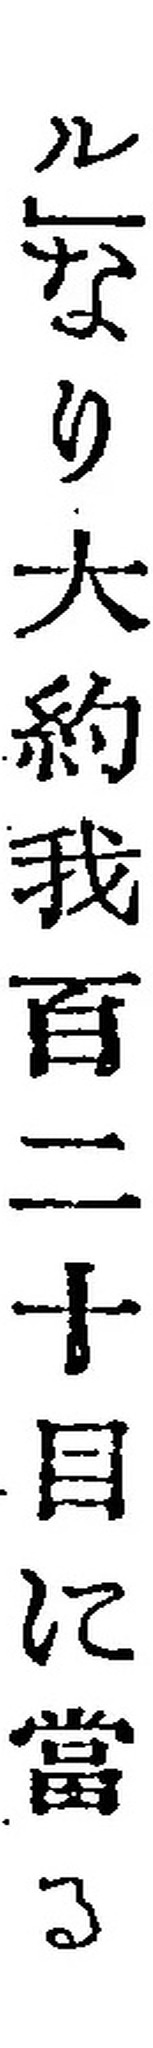ル]なり大約我百二十目に当る
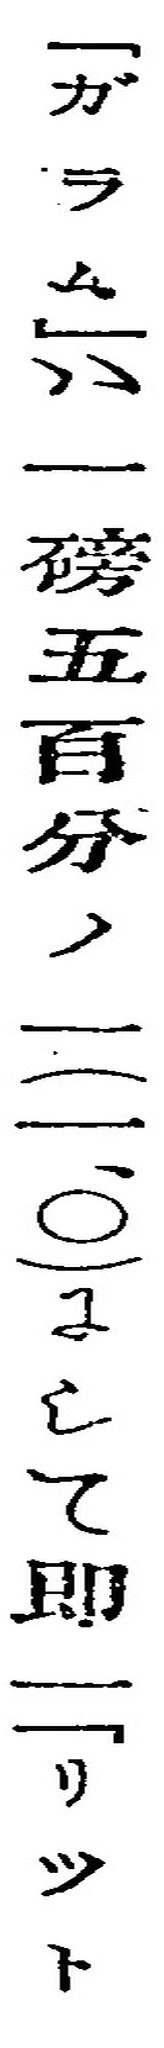[ガラム]は一磅五百分の一[一、〇]にして即一[リツト
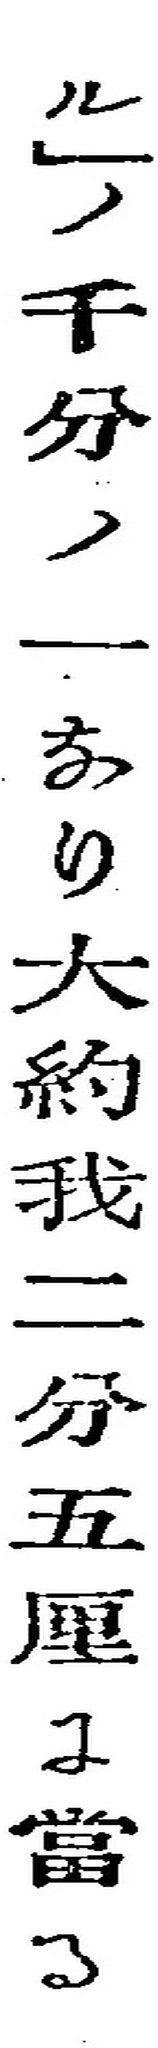ル]の千分の一なり大約我二分五厘に当る
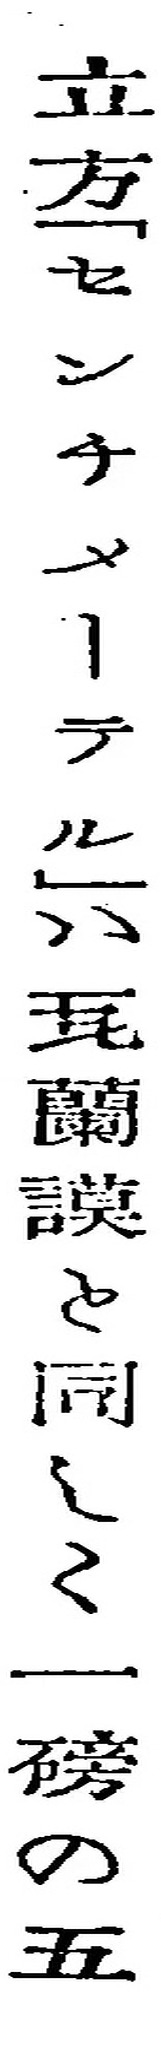立法[センチメーテル]は瓦蘭謨と同しく一磅の五
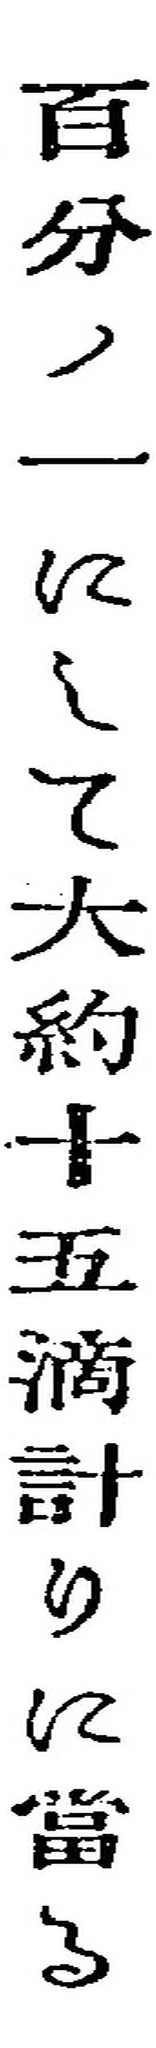百分の一にして大約十五滴計りに当る
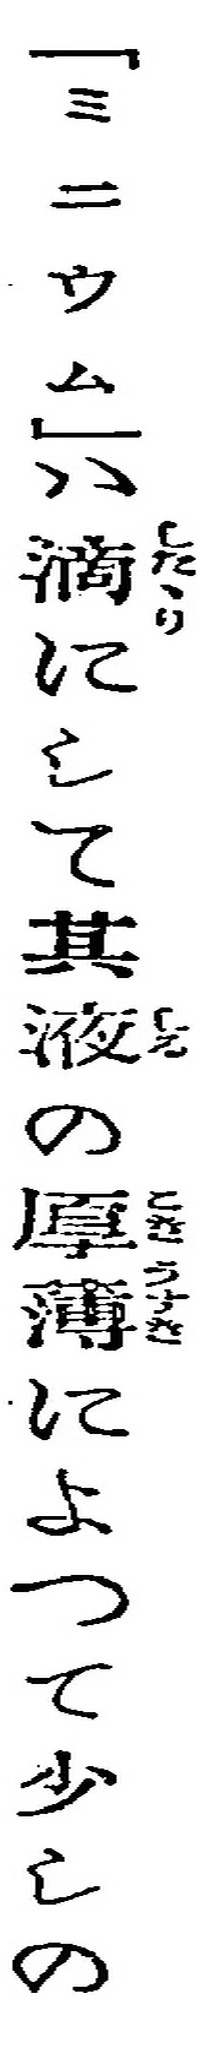[ミニウム]は滴にして其液の厚薄によつて少しの
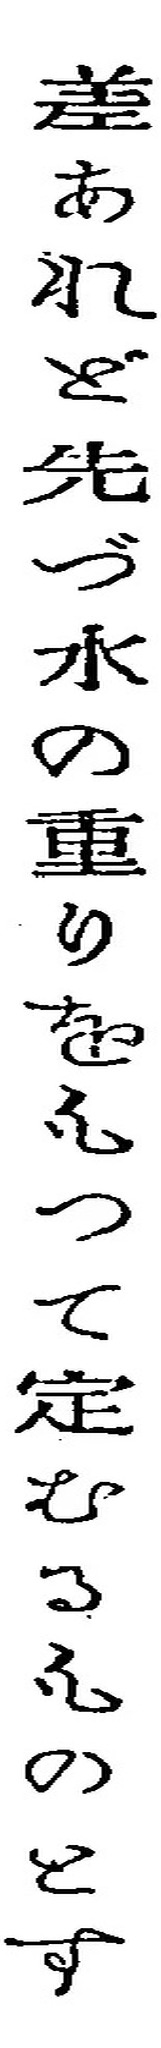差あれど先づ水の重りをもつて定むるものとす
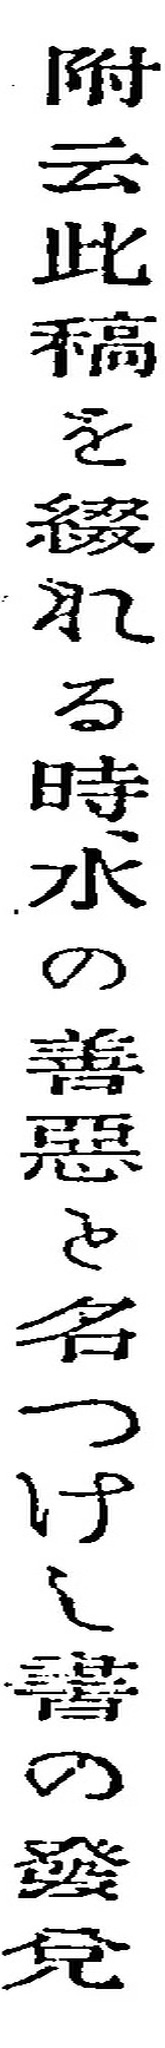其云此稿を綴れる時、水の善悪を名つけし書の發兌
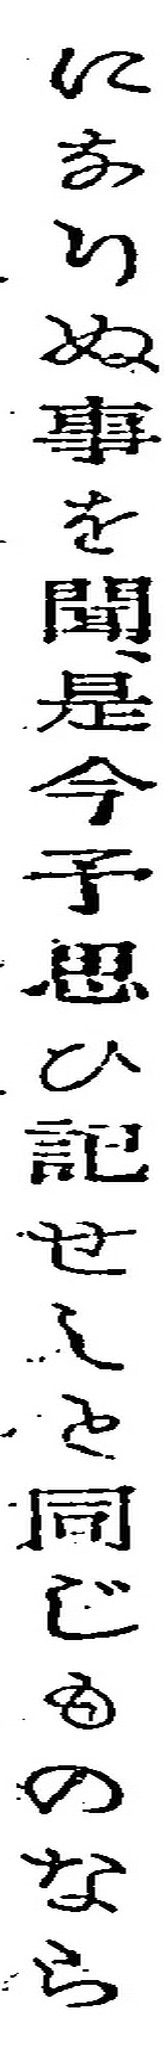になりぬ事を聞、是今予思ひ記せしと同じものなら
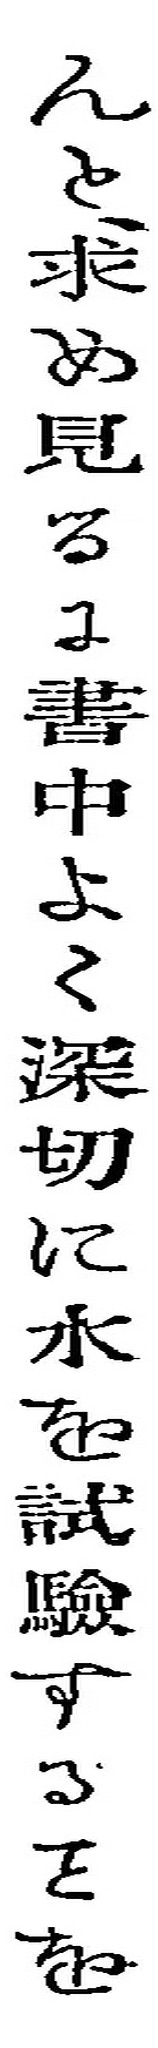んと、求め見るに書中よく深切るに水を試験することを
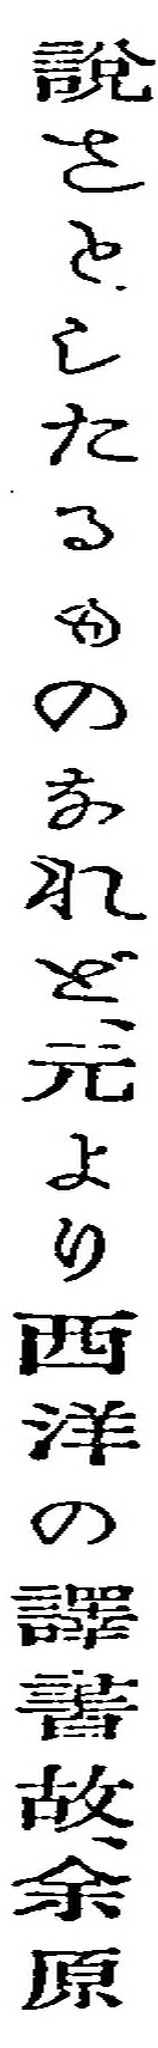説さとしたるものなれど、元より西洋の譯書故、余原
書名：飲水の心得 : 伝染病の予防
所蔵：国立国会図書館 National Diet Library, JAPAN
